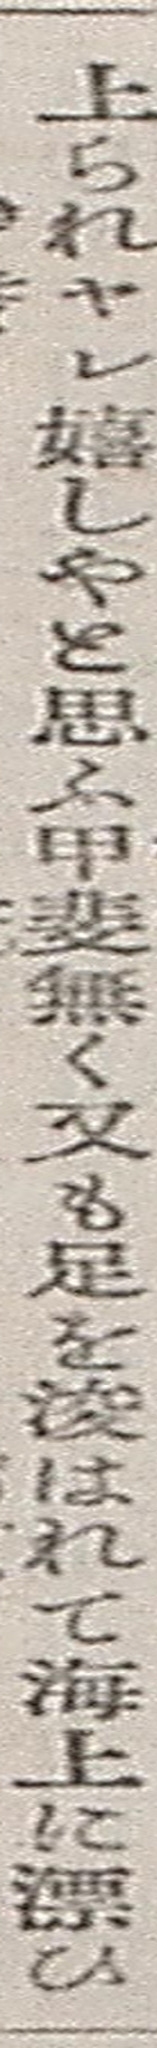上られヤレ嬉しやと思ふ甲斐無く又も足を浚はれて海上に漂ひ
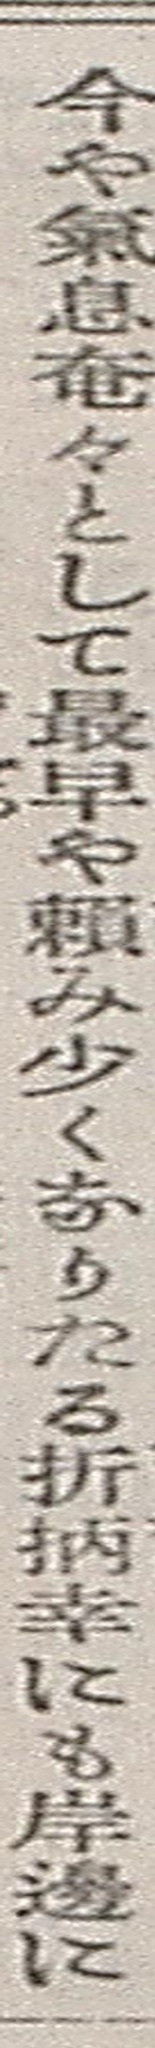今や気息奄々として最早や頼み少くなりたる折柄幸にも岸辺に
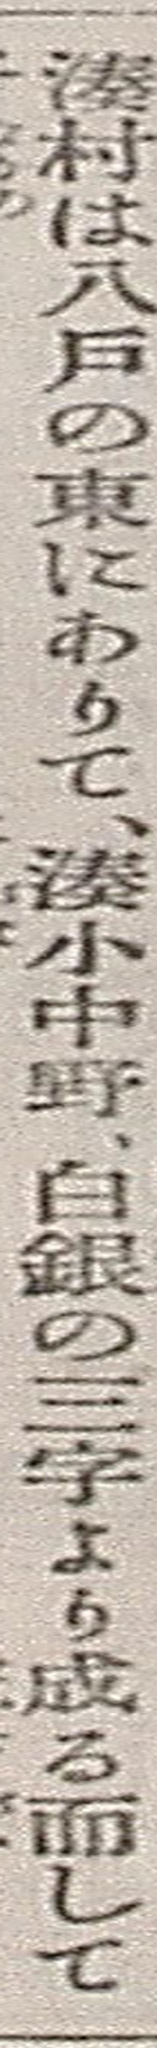湊村は八戸の東にありて、湊小中野、白銀の三字より成る而して
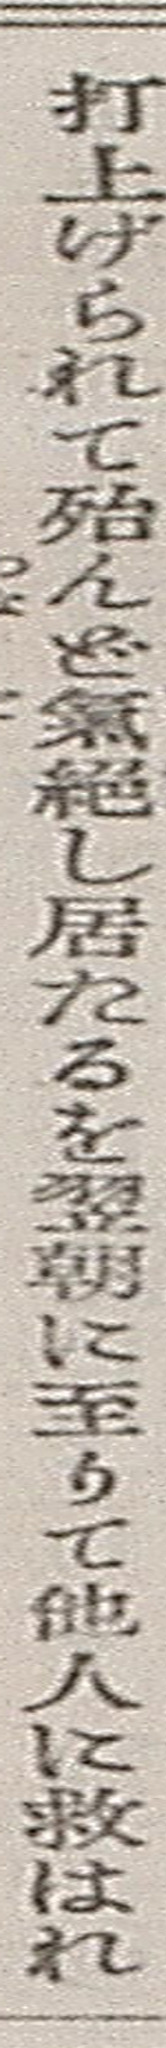打上げられて殆んど気絶し居たるを翌朝に至りて他人に救はれ
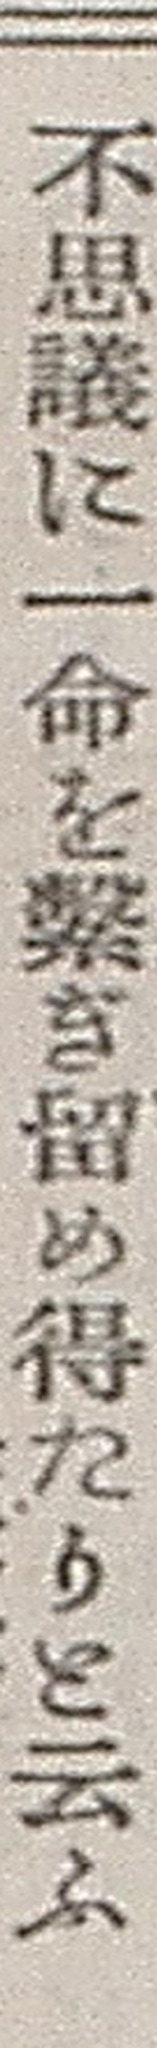不思議に一命を繋ぎ留め得たりと云ふ
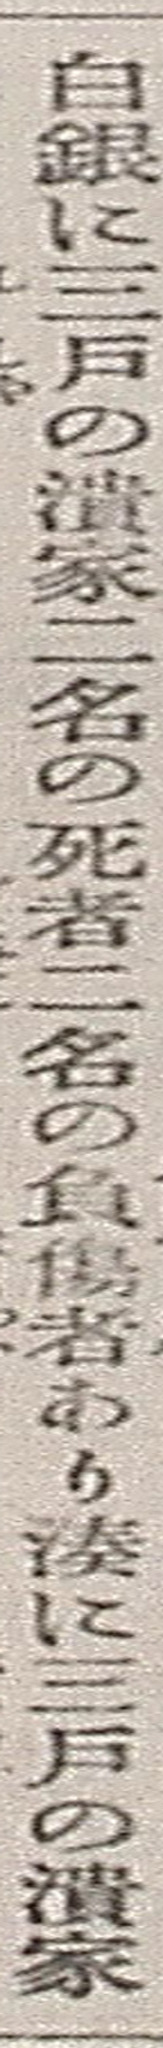白銀に三戸の潰家二名の死者二名の負傷者あり湊に三戸の潰家
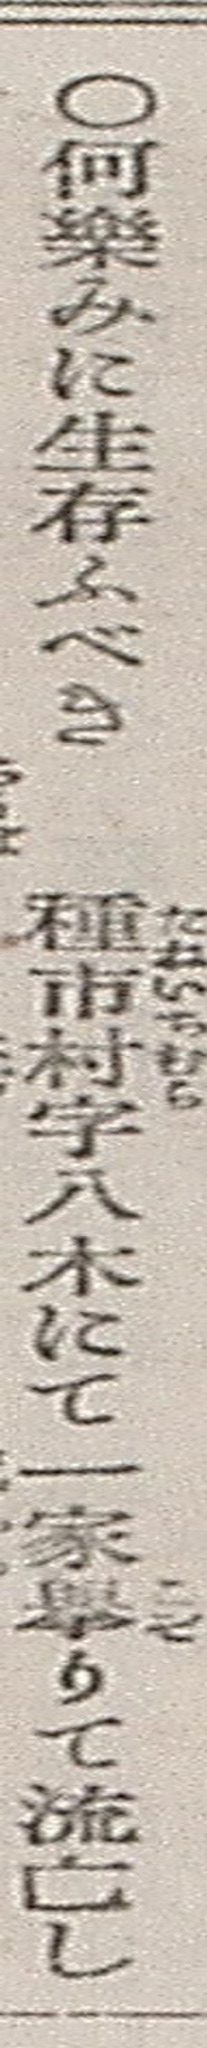〇何楽みに生存ふべき種市村字八木にて一家挙りて流亡し
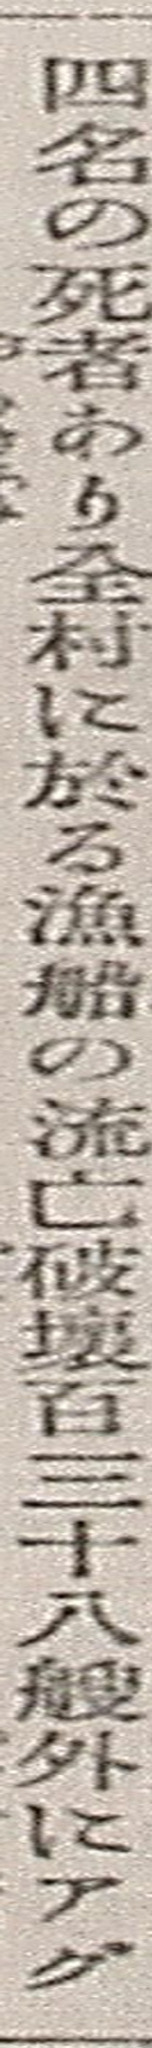四名の死者あり全村に於る漁船の流亡破壊百三十八艘外にアグ
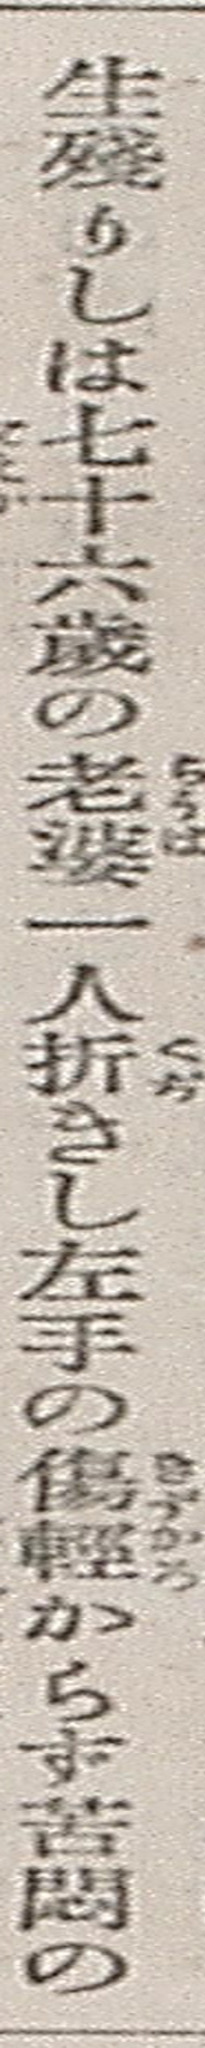生残りしは七十六歳の老婆一人折きし左手の傷軽からず苦悶の
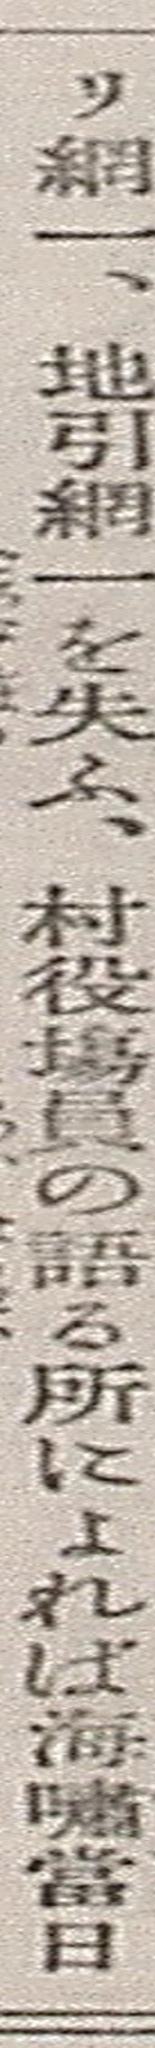リ網一、地引網一を失ふ、村役場員の語る所によれば海嘯当日
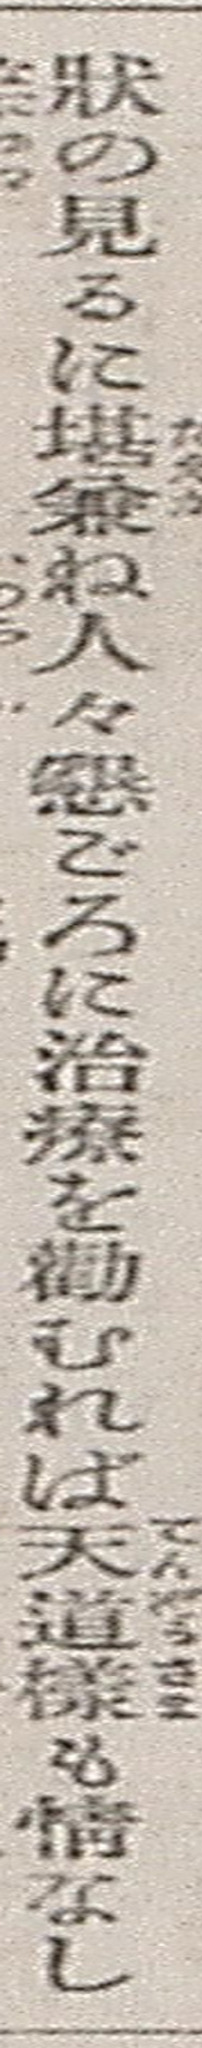状の見るに堪兼ね人々懇ごろに治療を勧むれば天道様も情なし
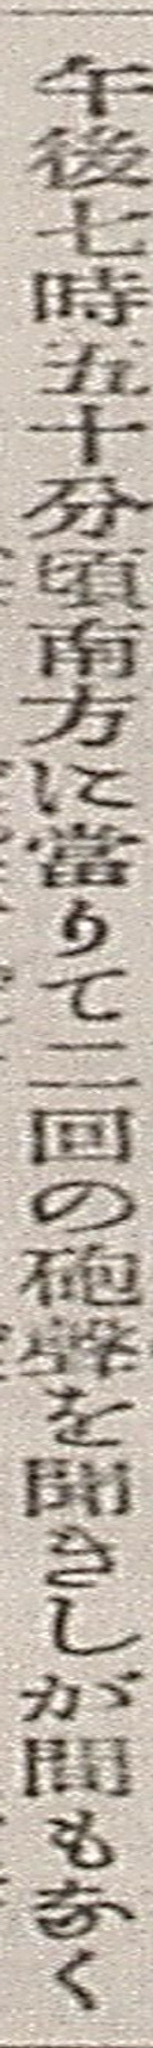午後七時五十分頃南方に当りて二回の砲声を聞きしが間もなく
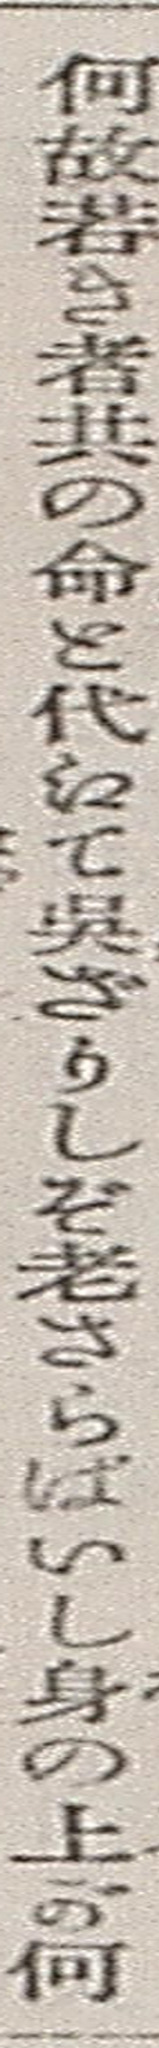何故若き者共の命と代えて呉ざりしぞ老さらばいし身の上が何
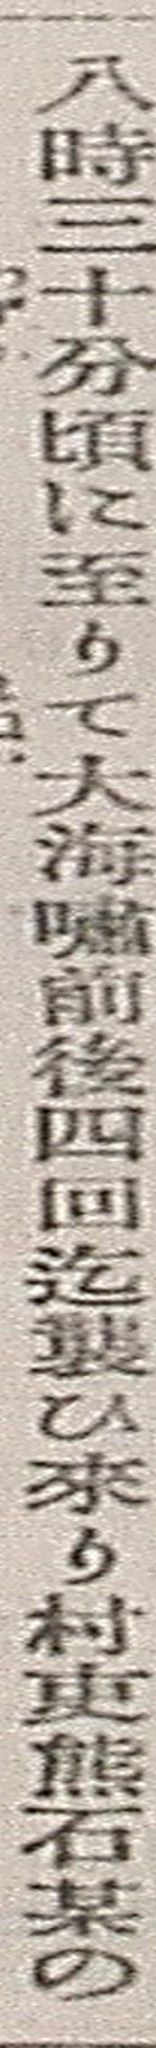八時三十分頃に至りて大海嘯前後四回迄襲ひ来り村吏熊石某の
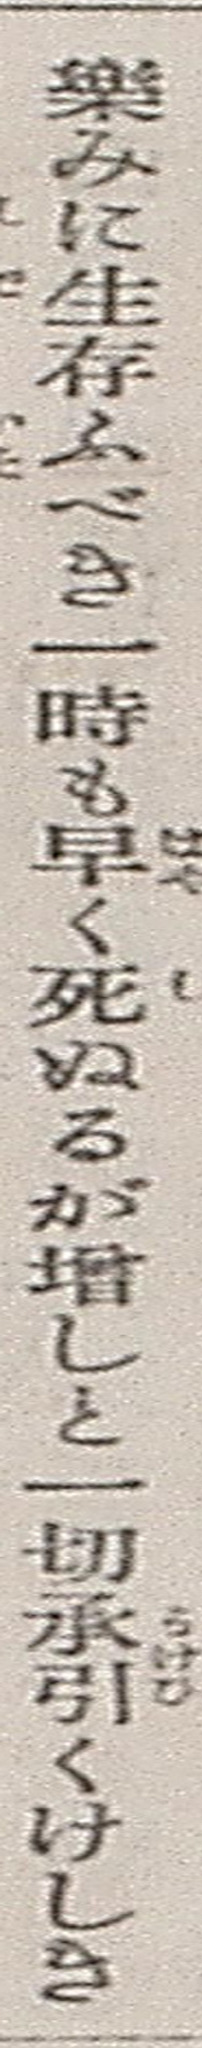楽みに生存ふべき一時も早く死ぬるが増しと一切承引くけしき
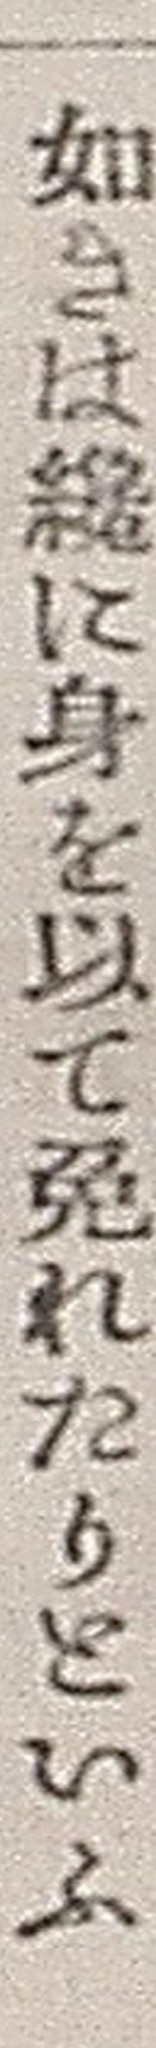如きは纔に身を以て免れたりといふ
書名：風俗畫報臨時増刊第百十九號　大海嘯被害録（中）
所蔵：東京大学地震研究所図書室 Earthquake Research Institute Library, The University of Tokyo, JAPAN
